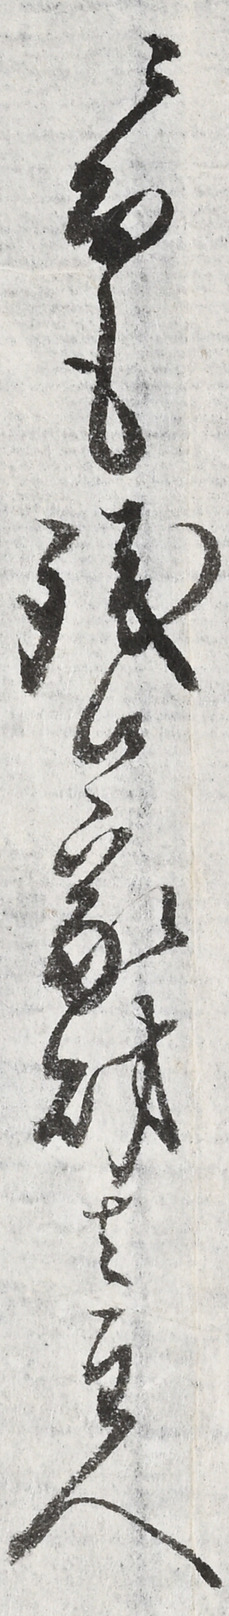ニ而も残候家財は主人
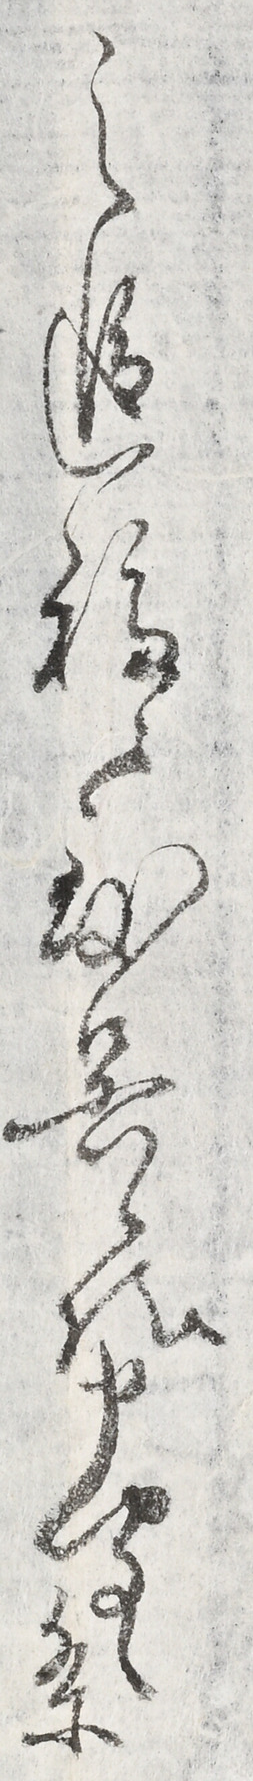之追福ニ致呉候様申聞候条
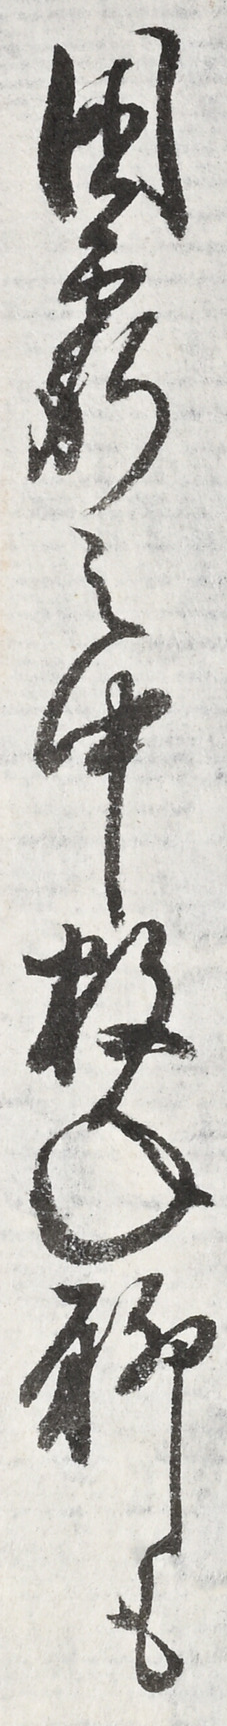困窮之中数年聊も

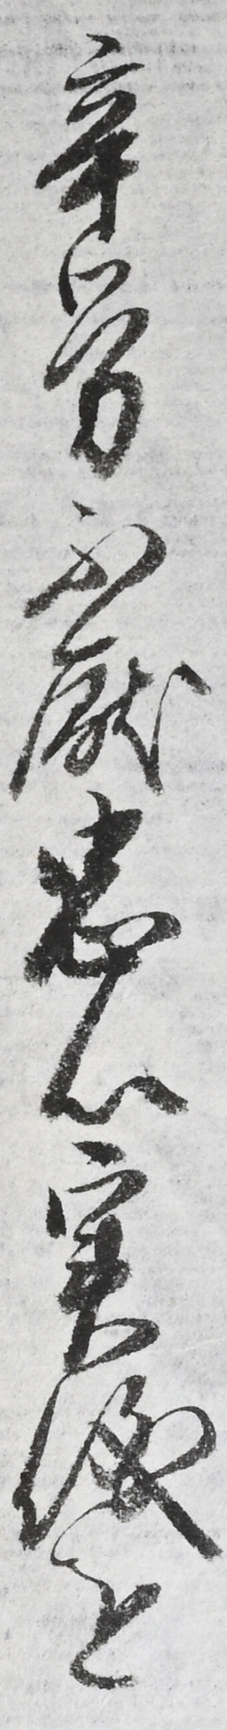辛労不厭忠心実儀を
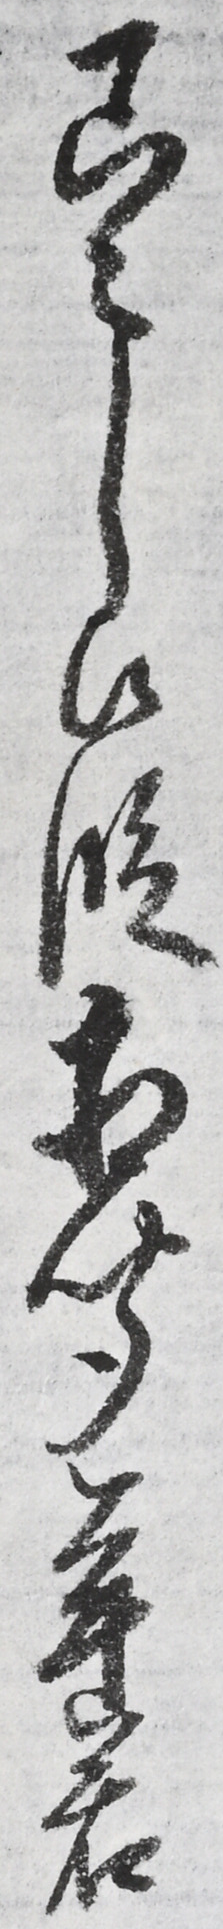尽し候段相聞年若
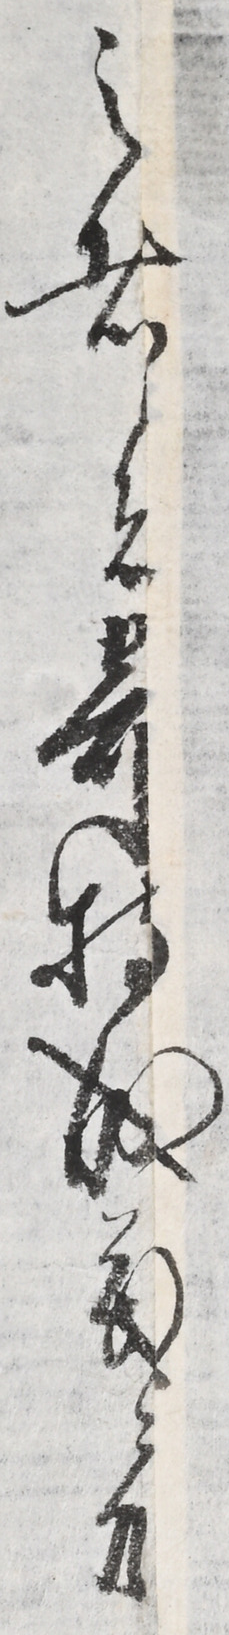之者には奇特成義ニ付
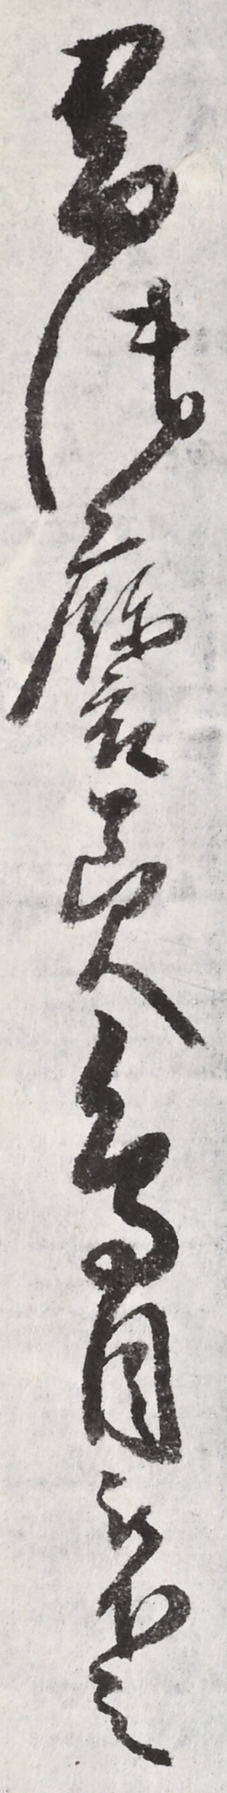為御褒美鳥目被下之
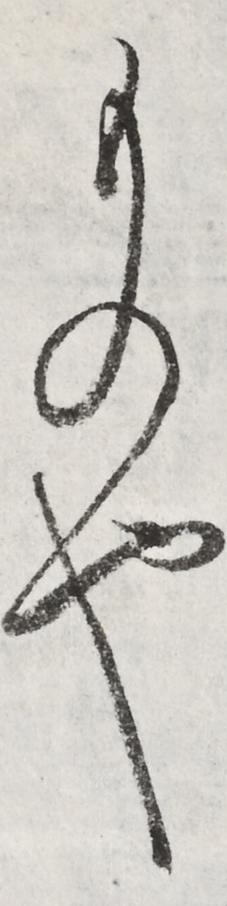もの也
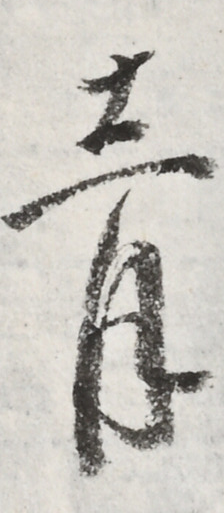十二月

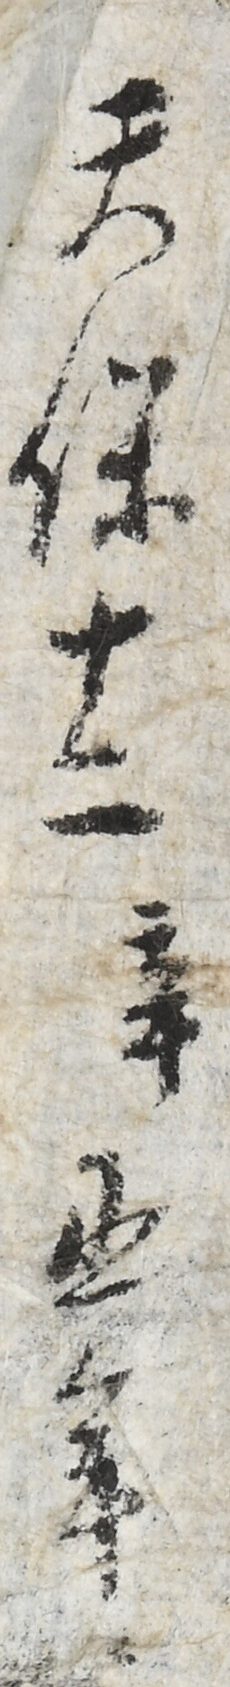天保十二辛丑年
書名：（書付）
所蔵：伊那市立高遠町図書館・合同会社AMANE
